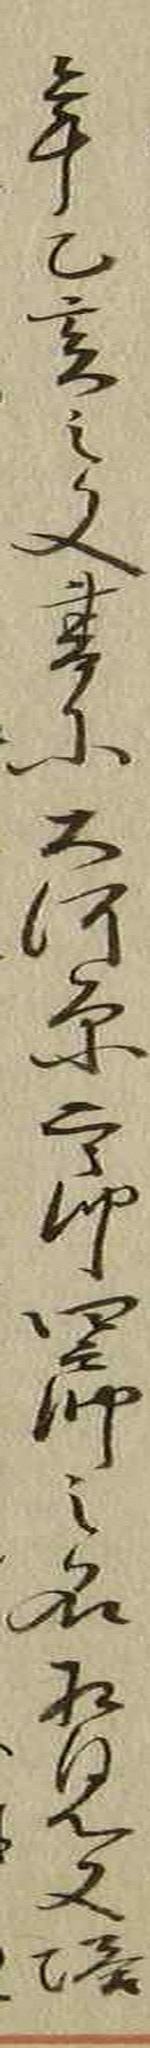年乙亥之文書に大河原二郎四郎之名相見又塔
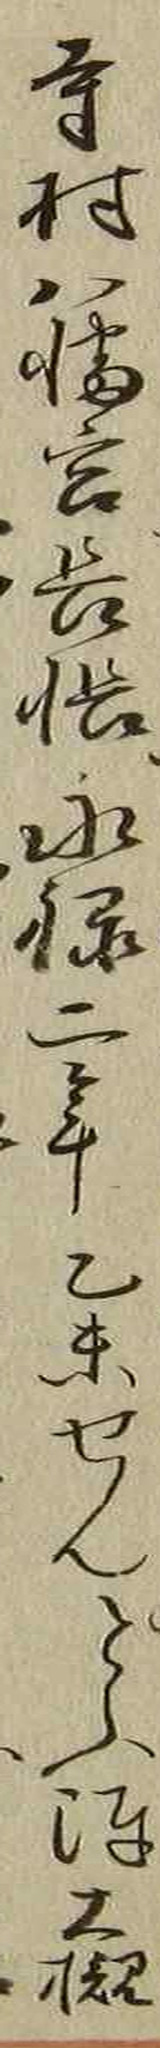寺村八幡宮長帳永禄二年乙未せんとふ陣大槻
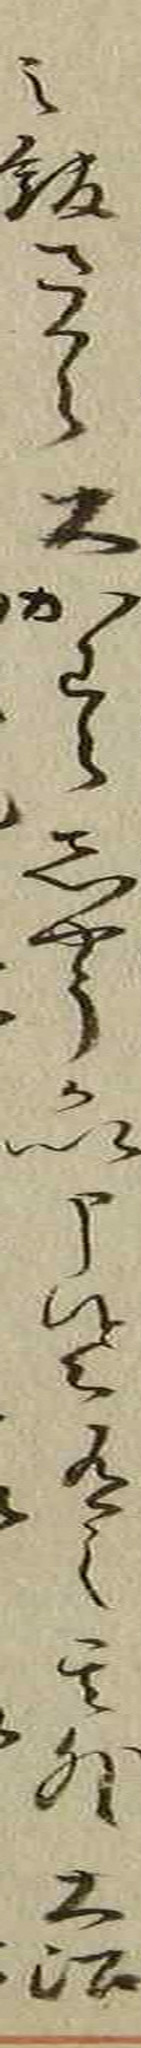之館さくら大かわらしやうかい申候と有之其外大沼
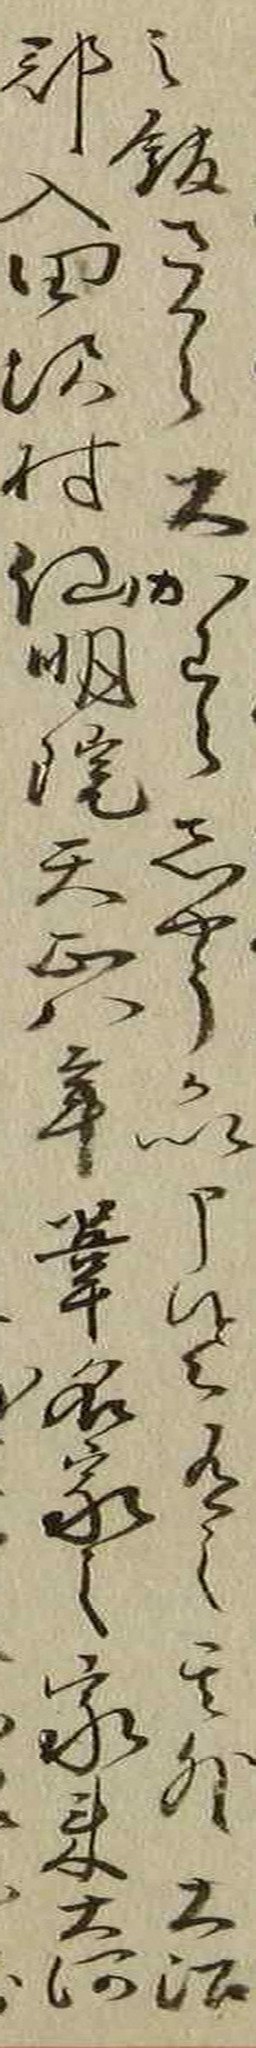郡入田沢仙明院天正八年葦名家之家来大河
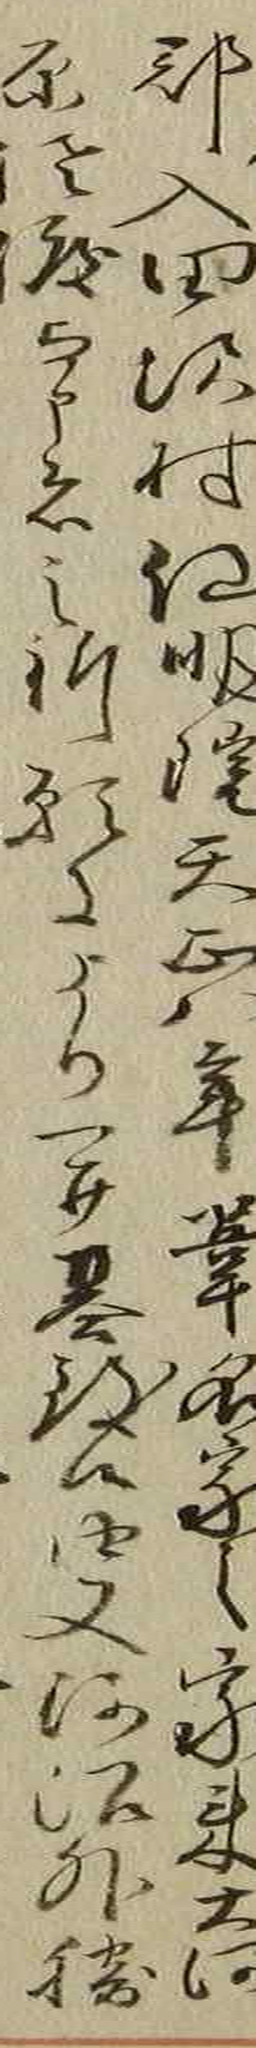原佐渡与申者之祈願により開基致候由又河沼外勝
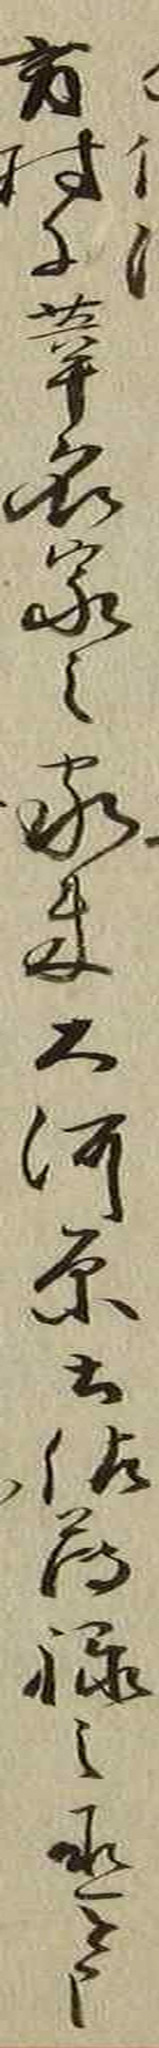方村に葦名家之家来大河原土佐薄禄之直と申
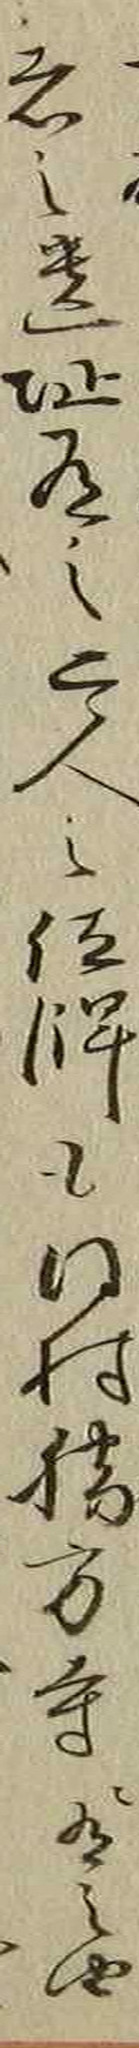者之遺址有之二人之位牌も同村勝方寺ニ有之由
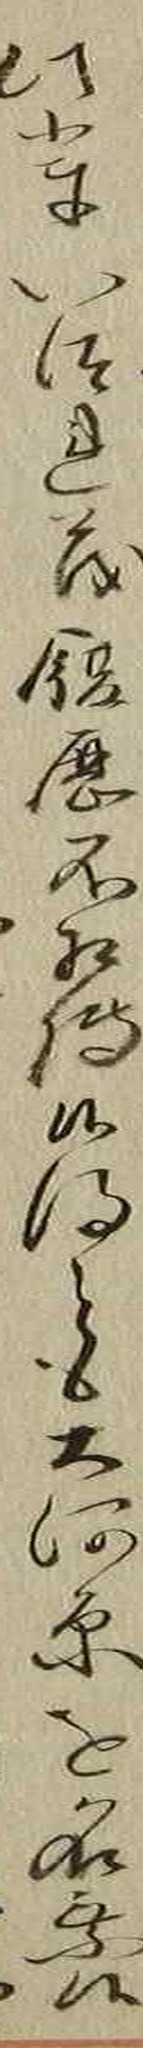此輩ハいつれも履歴不相伝候得とも大河原を名乗候
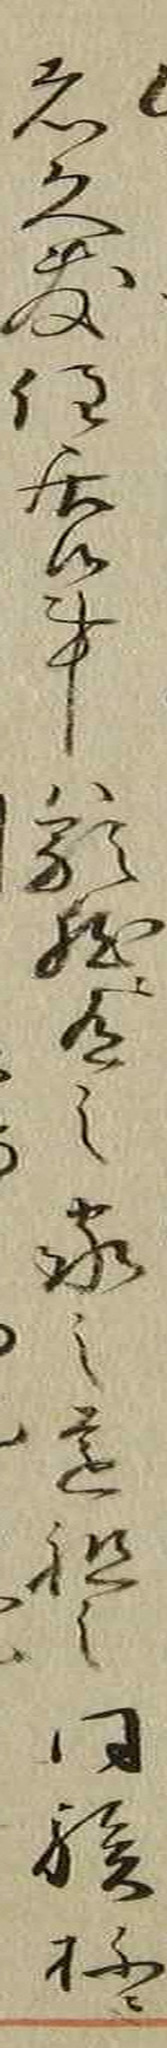者久敷住居候事ハ顕然ニ有之家之遠祖之同族抔ニ
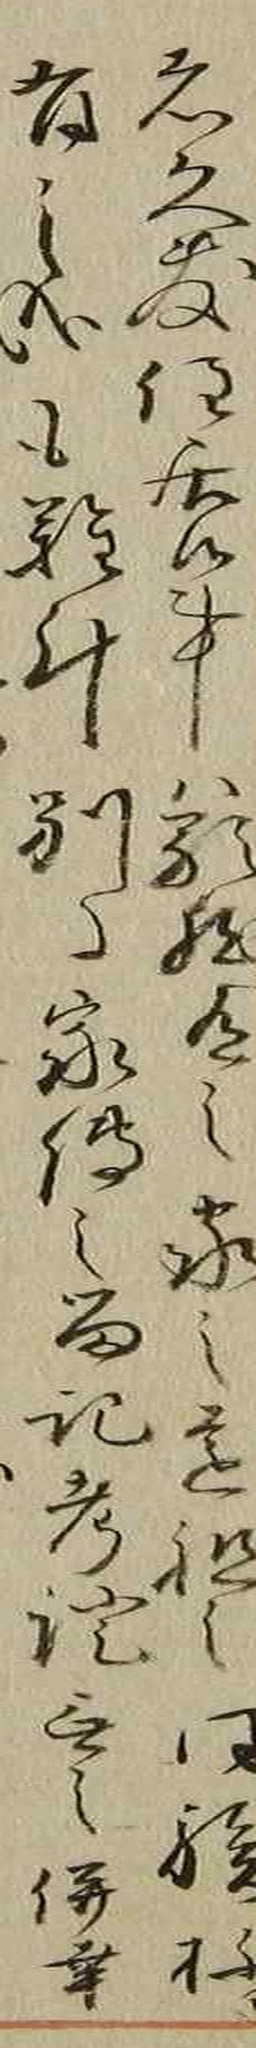有之哉も難計別に家傳之留記考証無之併幸
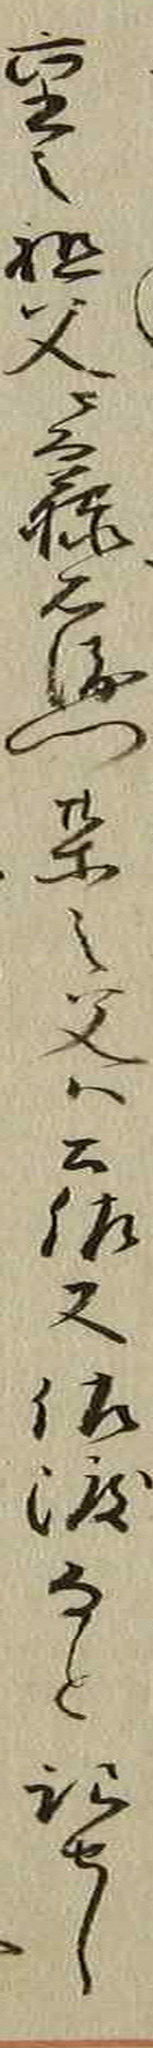重之祖父ニ而藤右衛門某之父ハ土佐又佐渡なと記せし
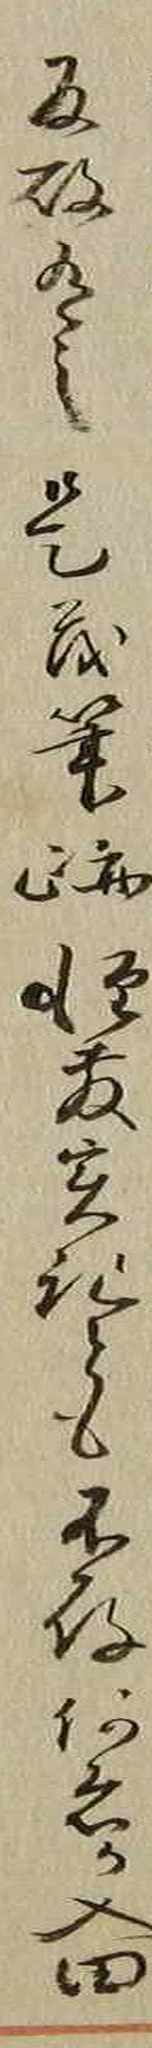反故有之是も筆跡軽敷実記とも不存何者か入田
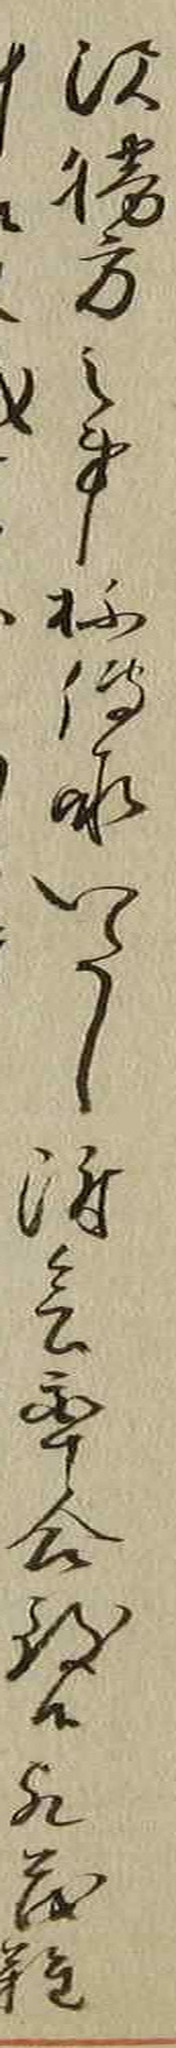沢勝方之事抔伝承いたし附会率合致候かも難
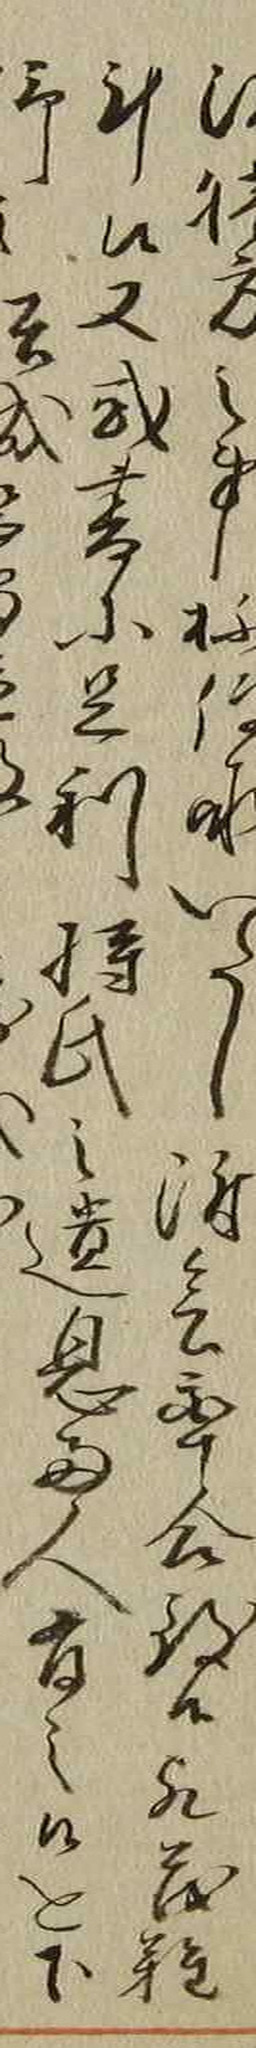計候又或書に足利持氏之遺息両人有之候と下
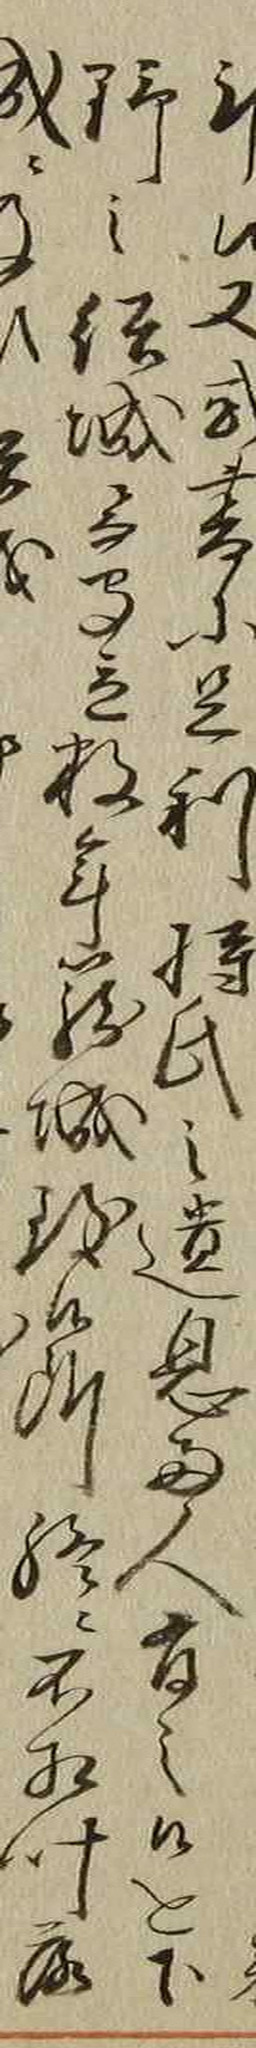野之結城ニ而守立数年籠城致候所終ニ不相叶落
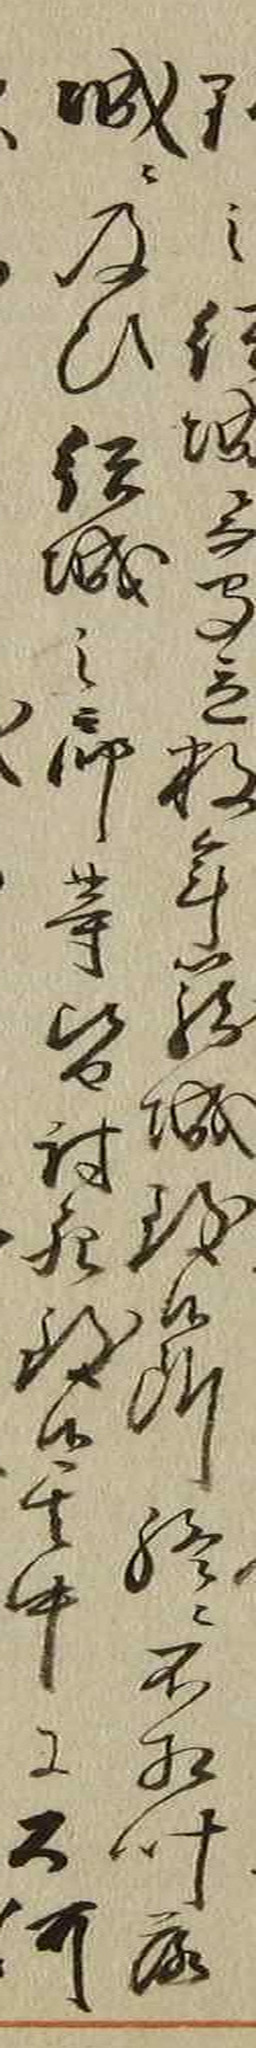城ニ及ひ結城之郎等皆討死致候其中に大河
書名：諸士系譜　巻之68　を之部2
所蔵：会津若松市立会津図書館
